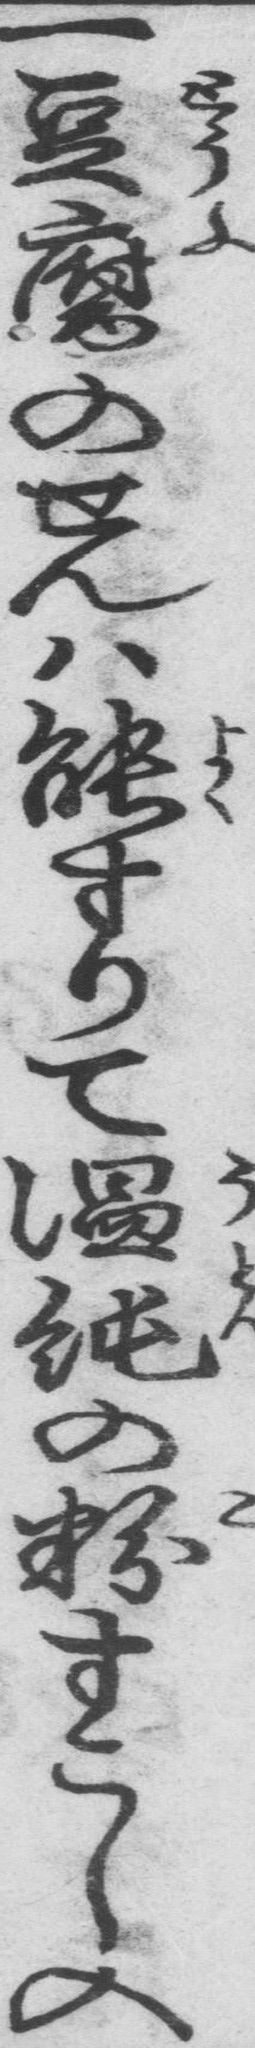一豆腐のせんは能すりて温純の粉すこし入

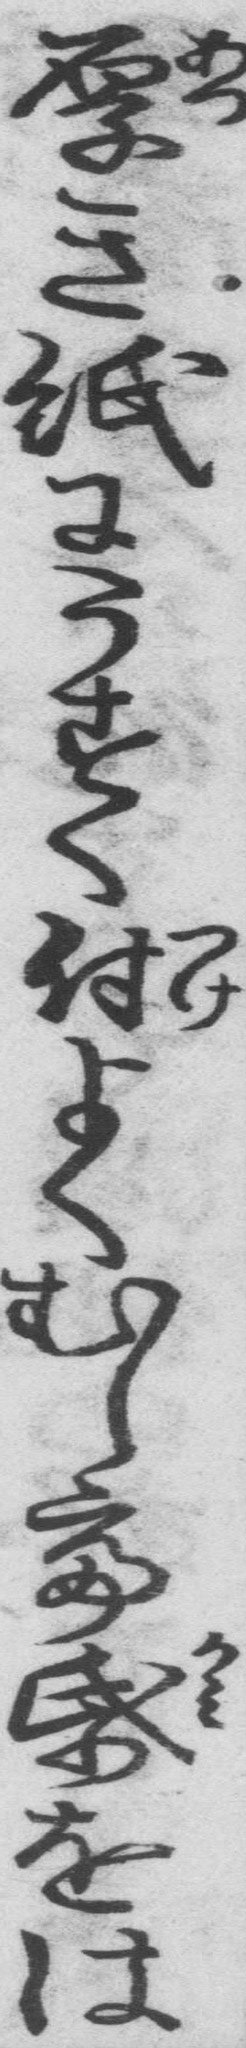厚き紙尓う春く付よくむし亭帋をは
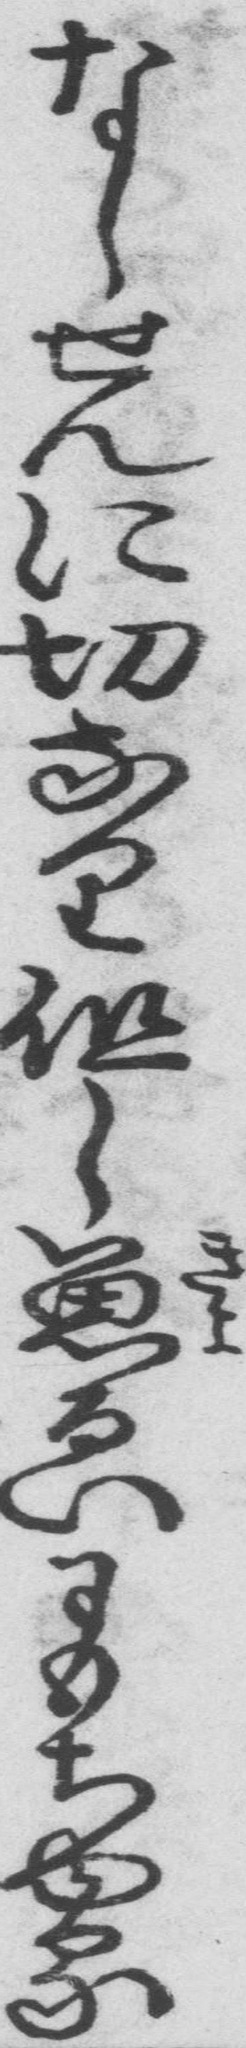なしせんに切な里但し魚るい尓もちゆ累
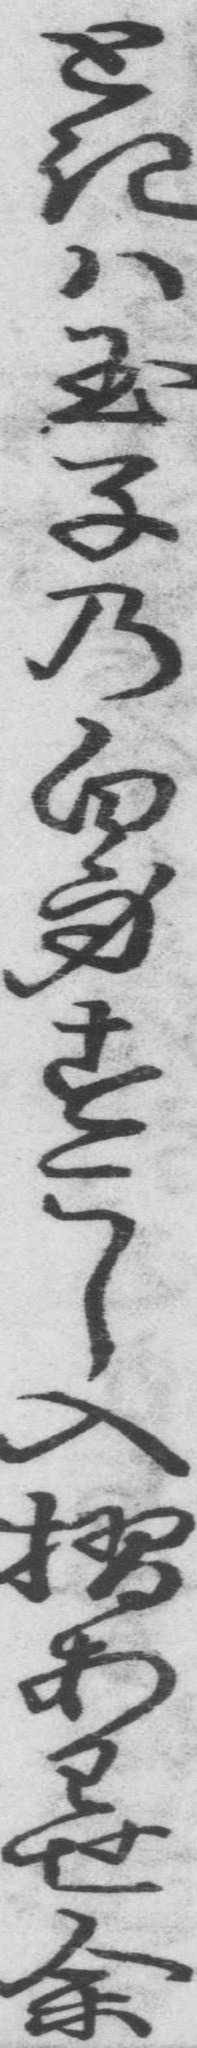と起は玉子乃白身春こし入摺あわせ余
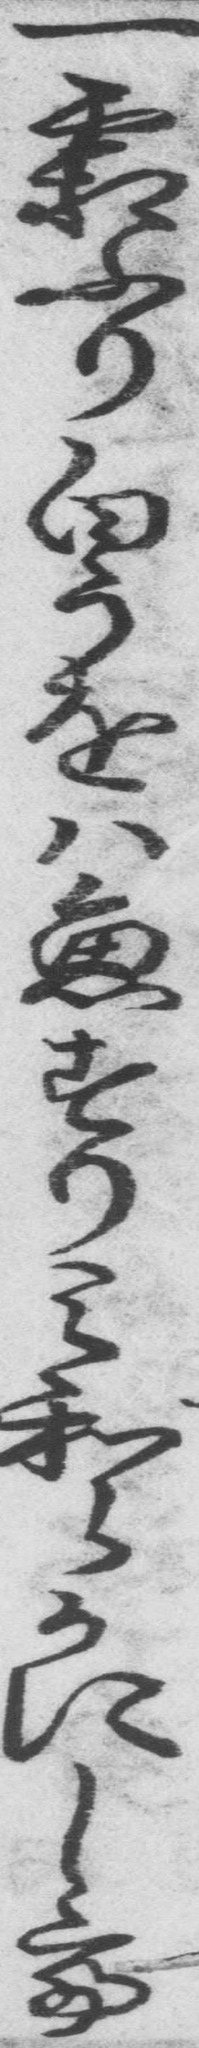一霜ふり白うをは魚春りみ和らかにし亭
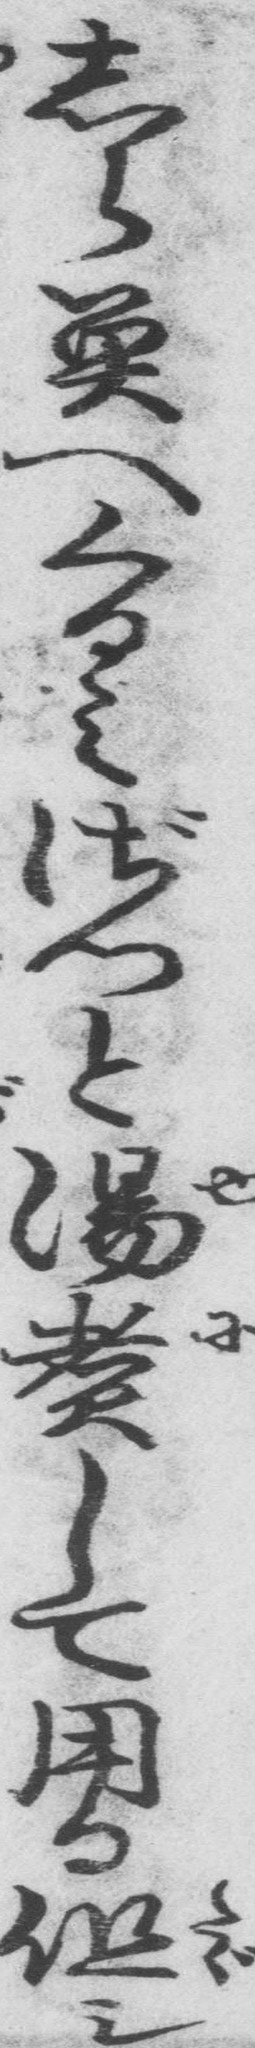志ら魚へくるみざつと湯煮して用る但し
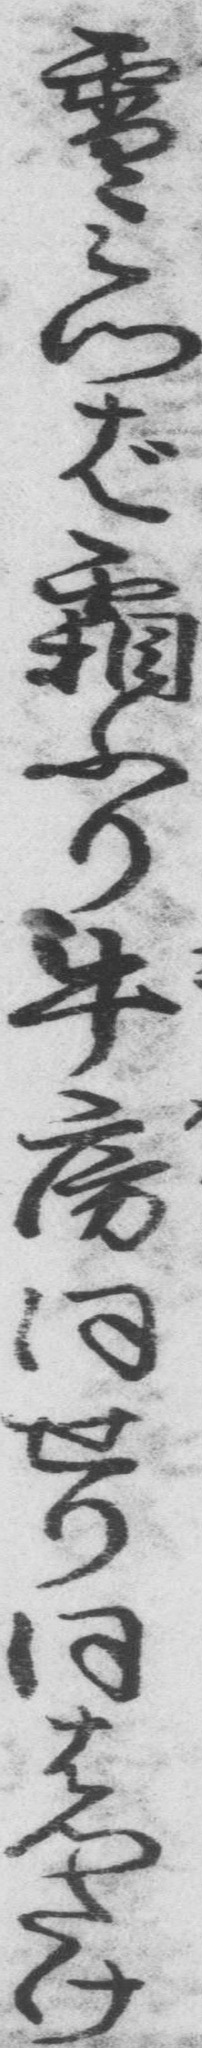雪みつば霜ふり牛房同せり同はつたけ
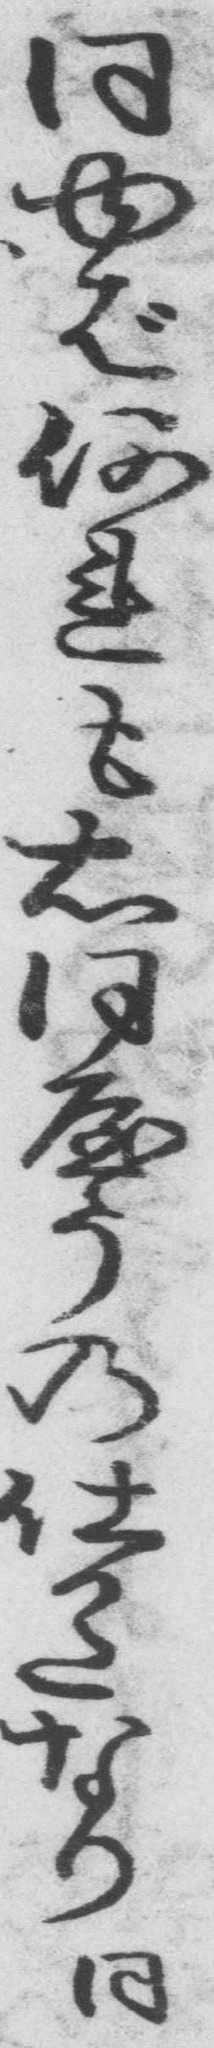同ゆば何連も右同屋う乃仕かたなり同
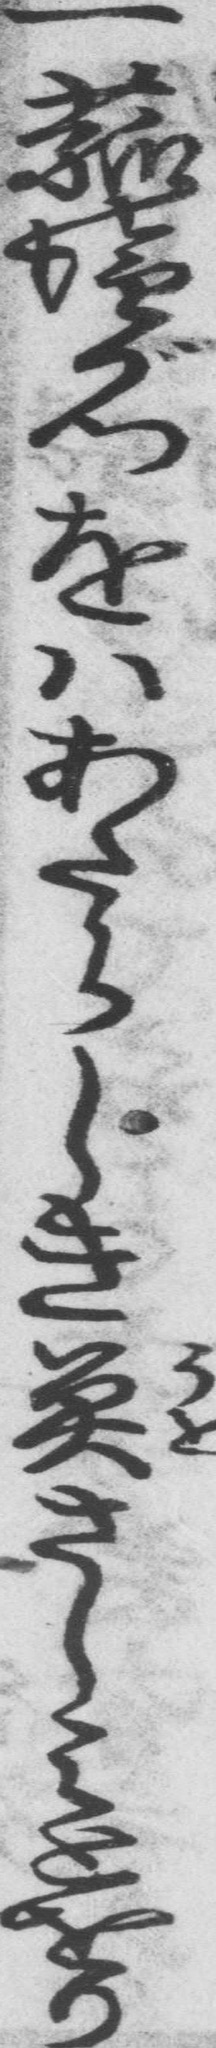一菰塩がつをはあたらしき魚さしみとをり
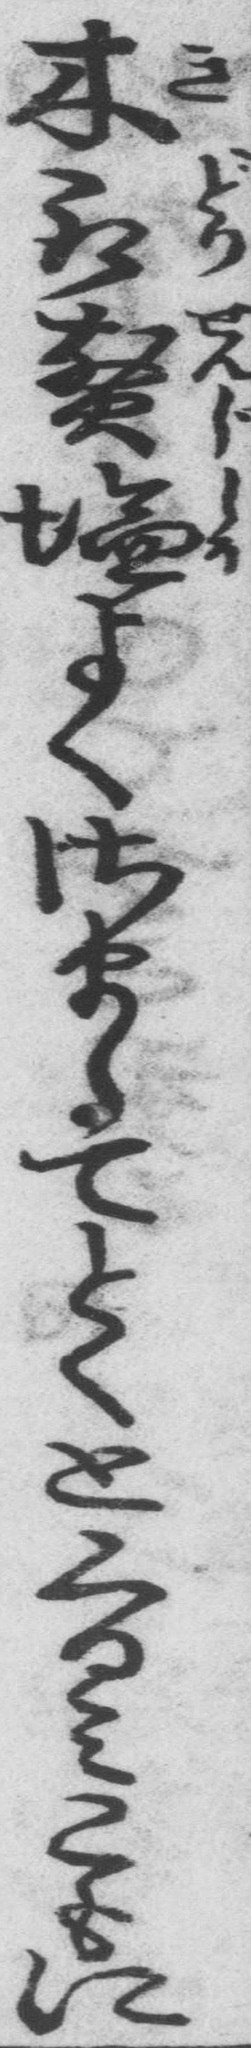木取煎塩よく佐ましてとくとくるみこもに
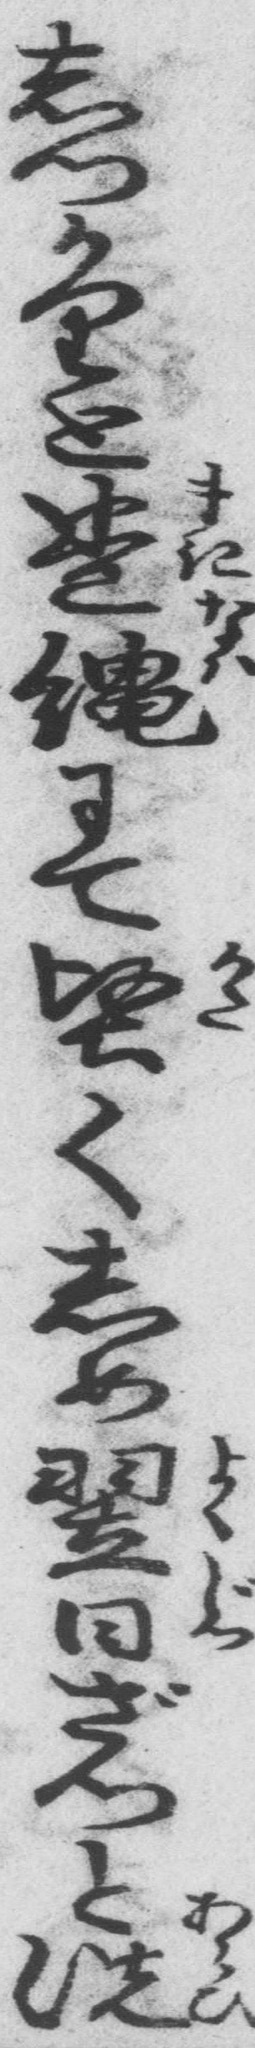志つか里と巻縄尓て堅く志め翌日ざつと洗
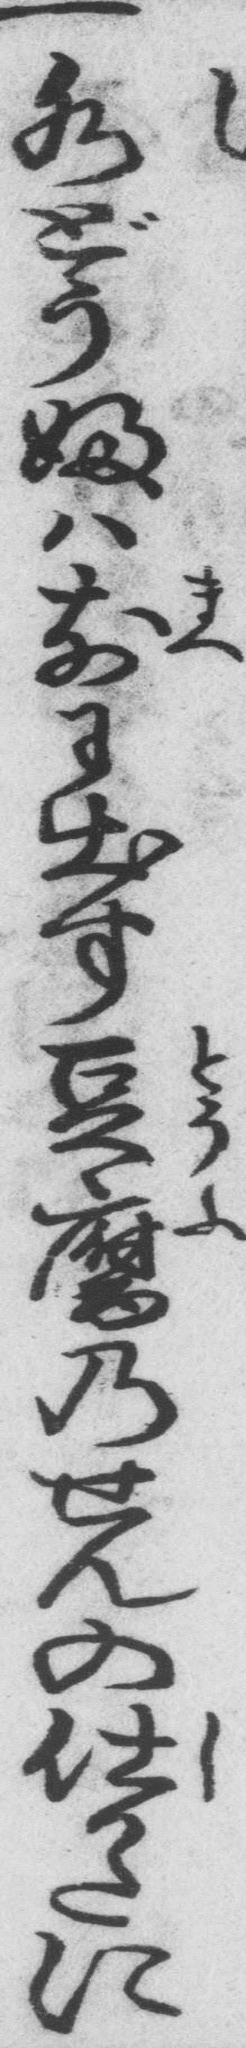一水どう婦は前尓出す豆腐乃せんの仕かたに
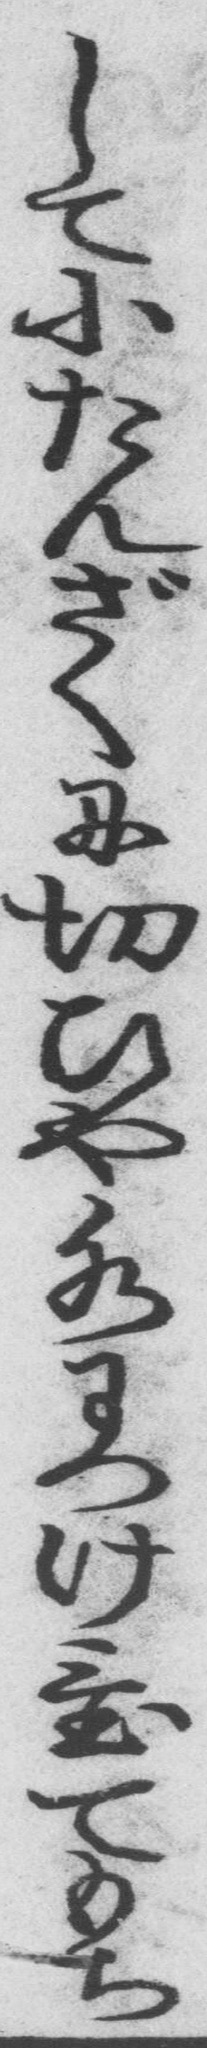して小たんざく丹切ひや水尓つけ置てもち
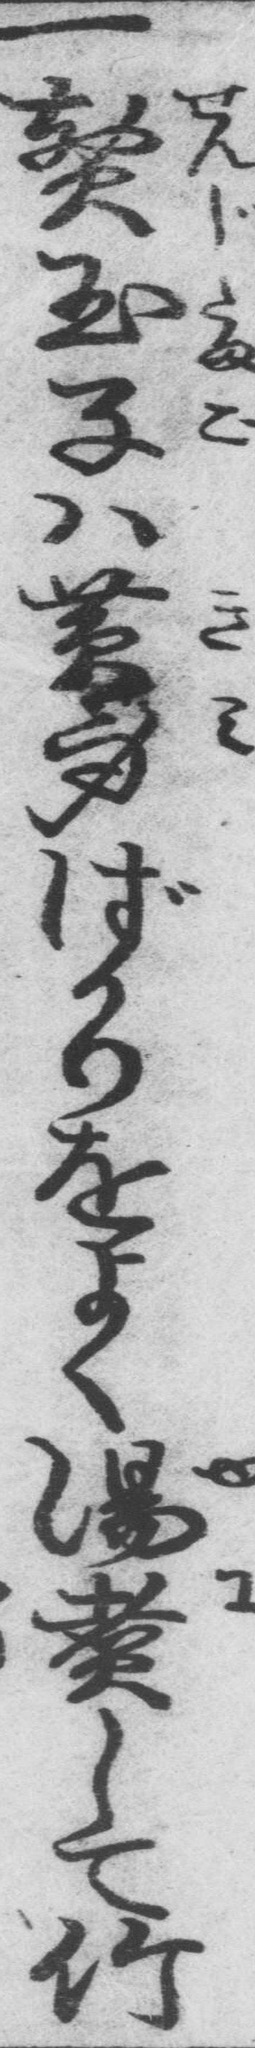一煎玉子は黄身ばかりをよく湯煮して竹
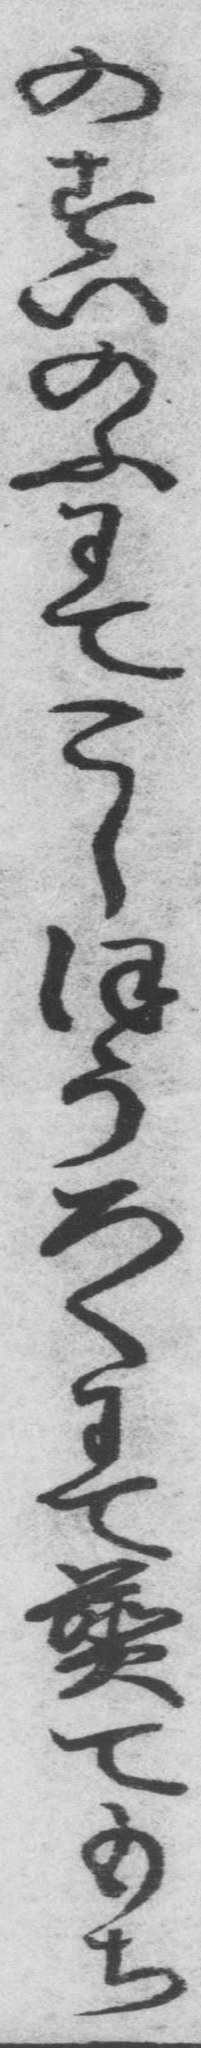の春いのふ尓てこしほうろく尓て煎てもち

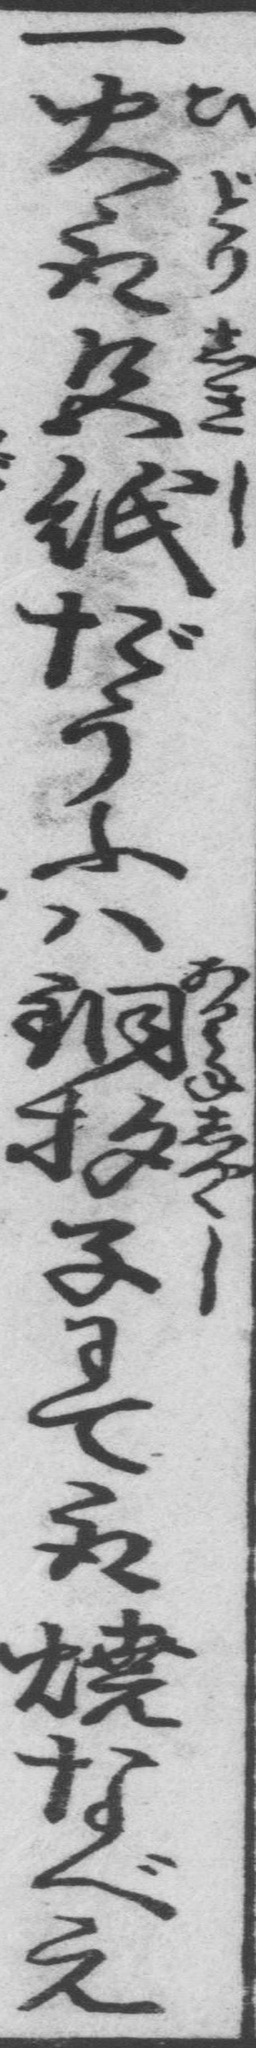一火取色紙だうふは銅杓子尓て取焼なべ之
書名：料理伊呂波庖丁
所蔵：大阪府立大学学術情報センター 国文学研究資料館
